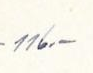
116
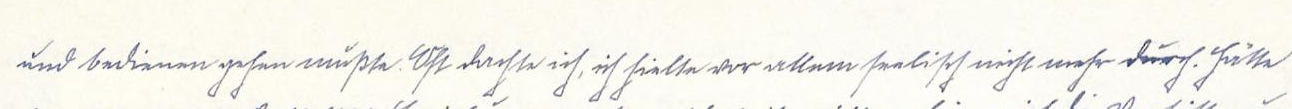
und bedienen gehen mußte. Oft dachte ich, ich hielte vor allem seelisch nicht mehr durch. Hätte
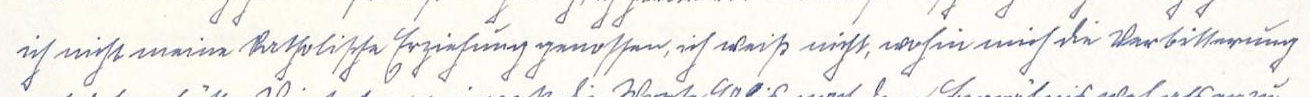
ich nicht meine katholische Erziehung genossen, ich weiß nicht, wohin mich die Verbitterung
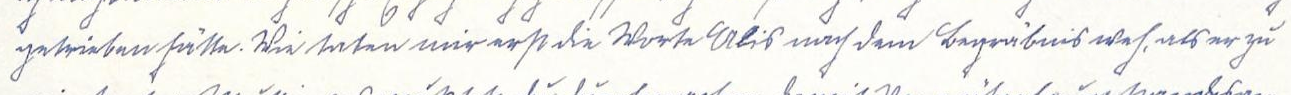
getrieben hätte. Wie taten mir erst die Worte Alis nach dem Begräbnis weh, als er zu
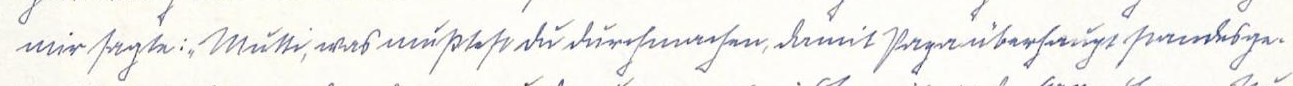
mir sagte.: „Mutti, was musstest du durchmachen, damit Papa überhaupt standesge-
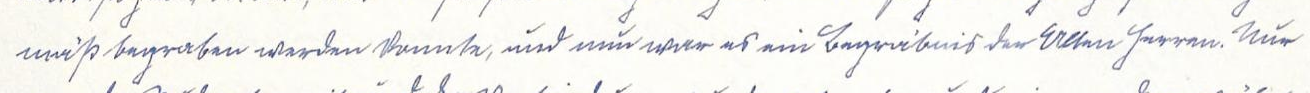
mäß begraben werden konnte, und nun war es ein Begräbnis der Alten Herrn. Nur
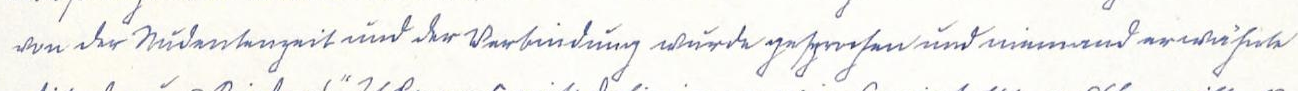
von der Studentenzeit und der Verbindung wurde gesprochen und niemand erwähnte
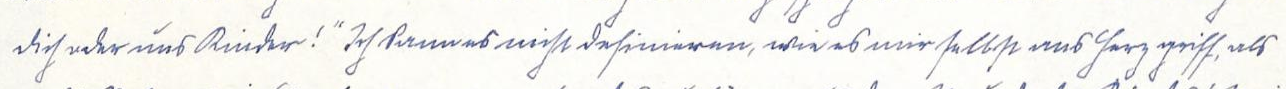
dich oder uns Kinder!“ Ich kann es nicht definieren, wie es mir selbst ans Herz griff, als
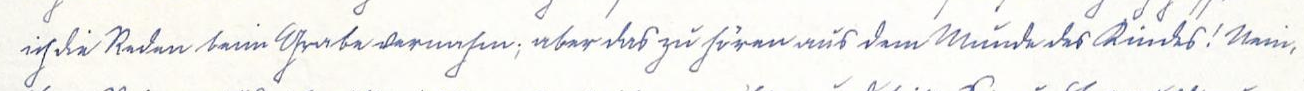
ich die Reden beim Grabe vernahm; aber das zu hören aus dem Mund des Kindes! Nein,
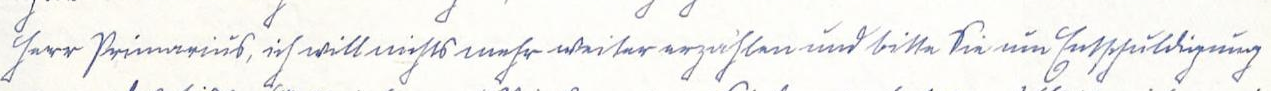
Herr Primarius, ich will nichts mehr weiter erzählen und bitte Sie um Ertschuldigung
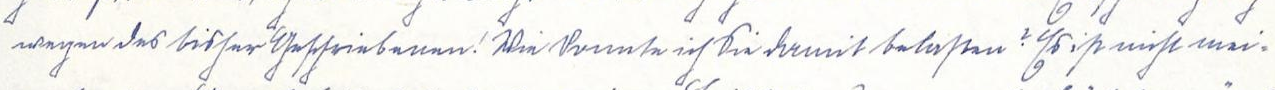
wegen des bisher Geschriebenen! Wie konnte ich Sie damit belasten? Es ist nicht mei-
